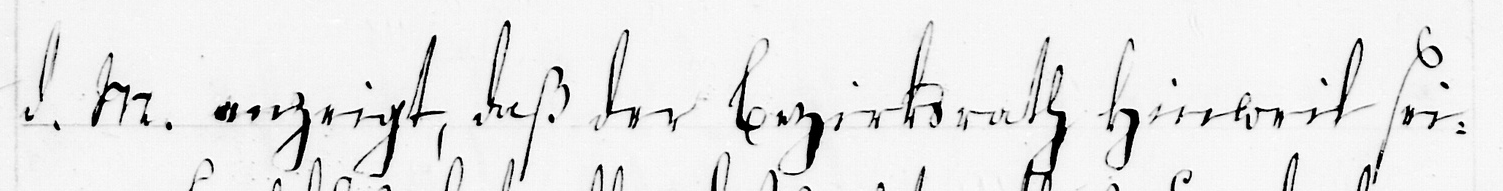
d. M. anzeigt, daß der Bezirksrath Hinweil sei¬
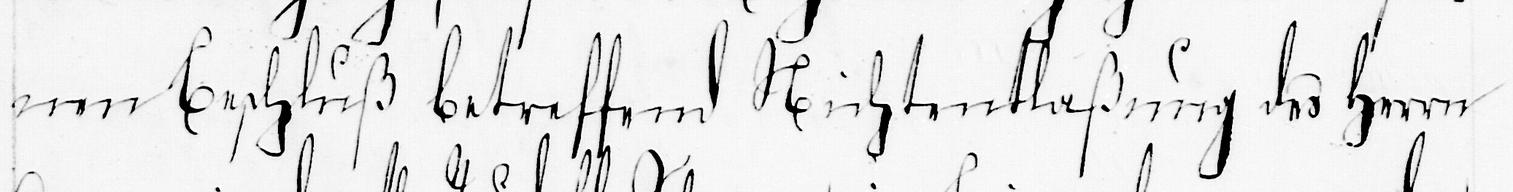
nen Beschluß betreffend Nichtentlaßung des Herrn
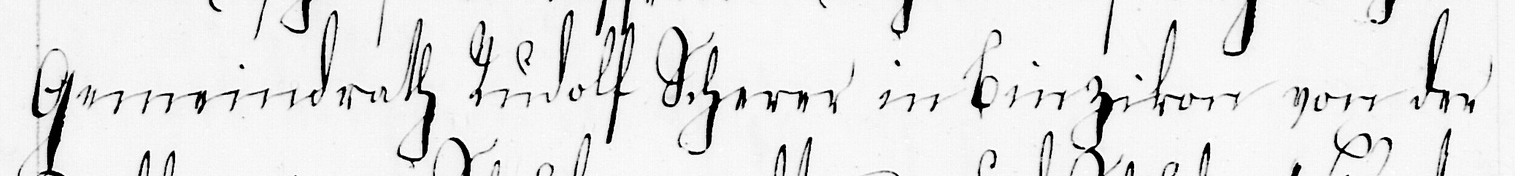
Gemeindrath Rudolf Scherer in Binzikon von der
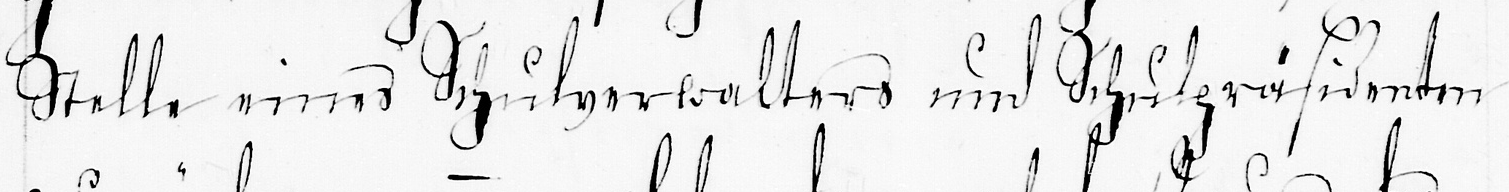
Stelle eines Schulverwalters und Schulpräsidenten
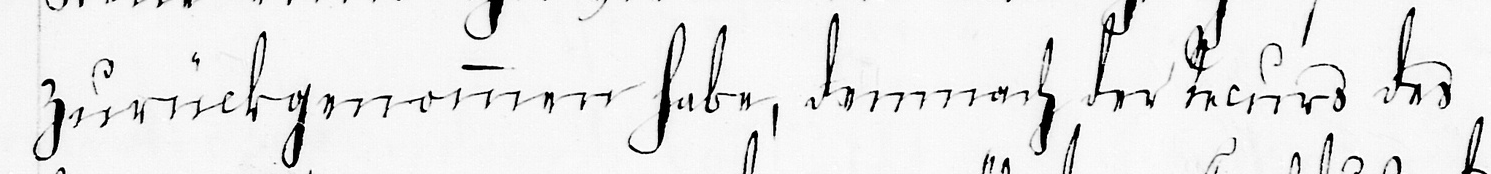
zurückgenommen habe, demnach der Recurs des
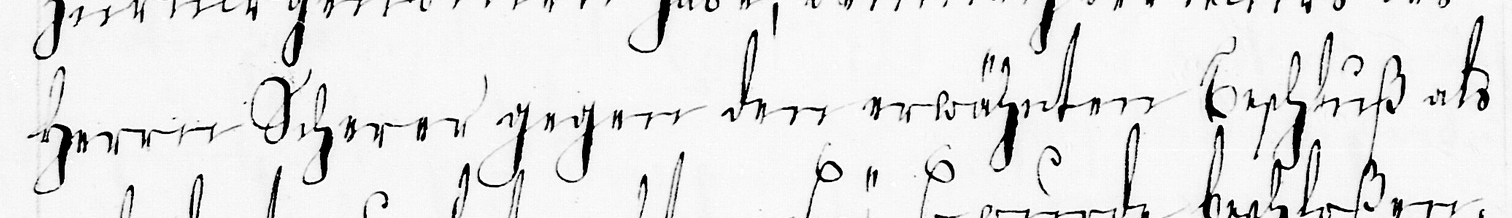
Herrn Scherer gegen den erwähnten Beschluß als
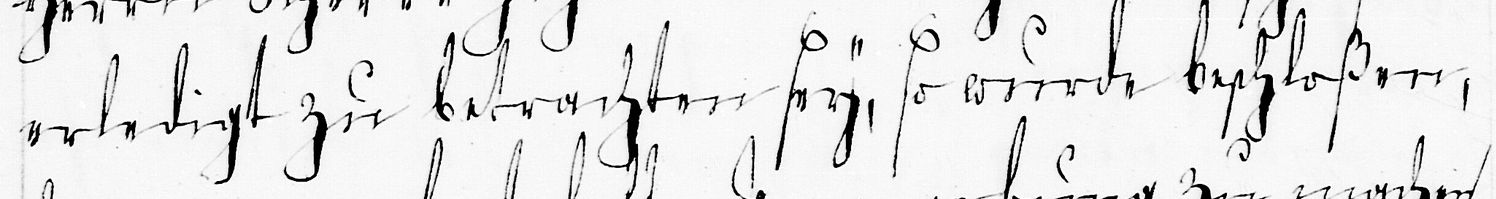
erledigt zu betrachten sey, so wurde beschloßen,
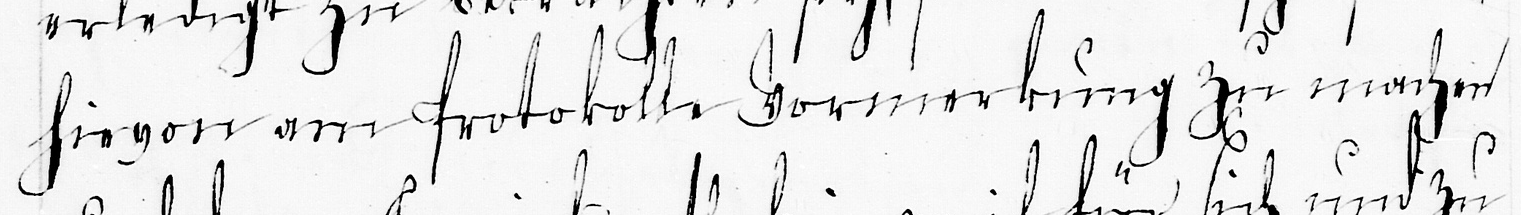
hievon am Protokolle Vormerkung zu machen
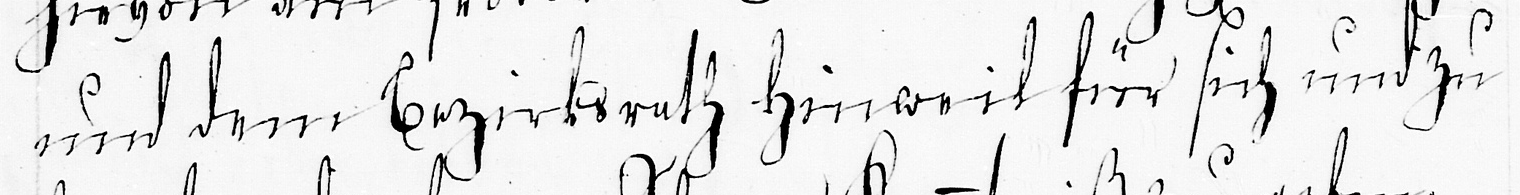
und dem Bezirksrath Hinweil für sich und zu
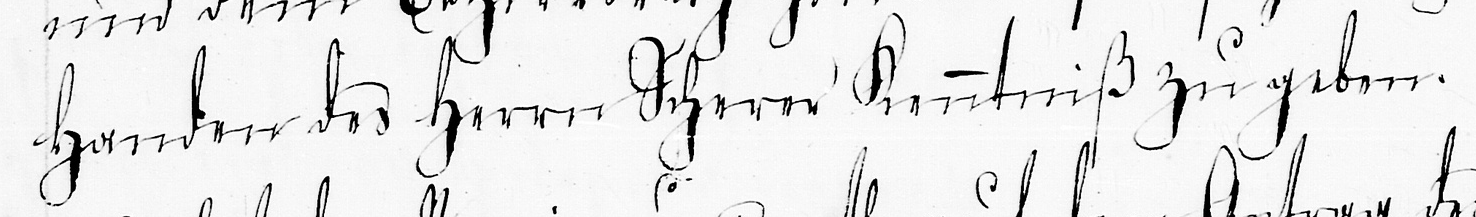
Handen des Herrn Scherer Kenntniß zu geben.
